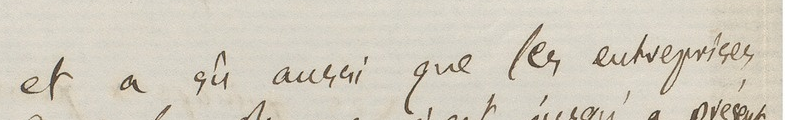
et a sû aussi que les entreprises
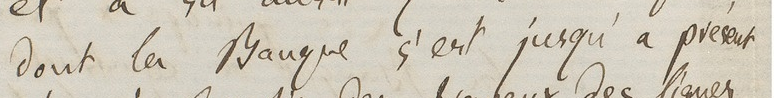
dont la Banque s'est jusq'a présent
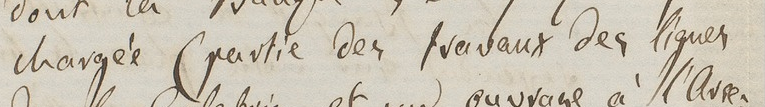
chargée (partie des travaux des lignes
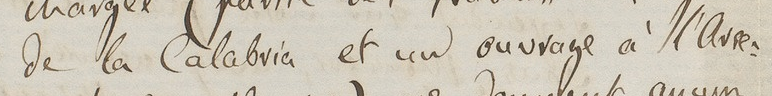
de la Calabria et un ouvrage à l'Arse-
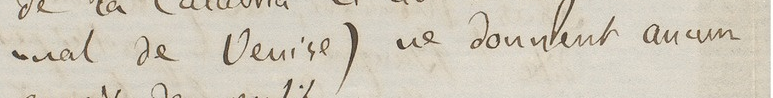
nal de Venise) ne donnent aucun
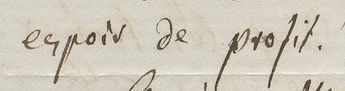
espoir de profit.
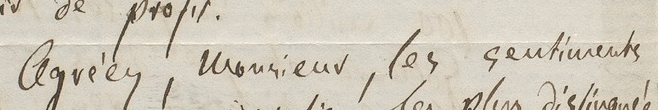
Agréez, Monsieur, les sentiments
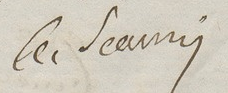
G. Scanzi
